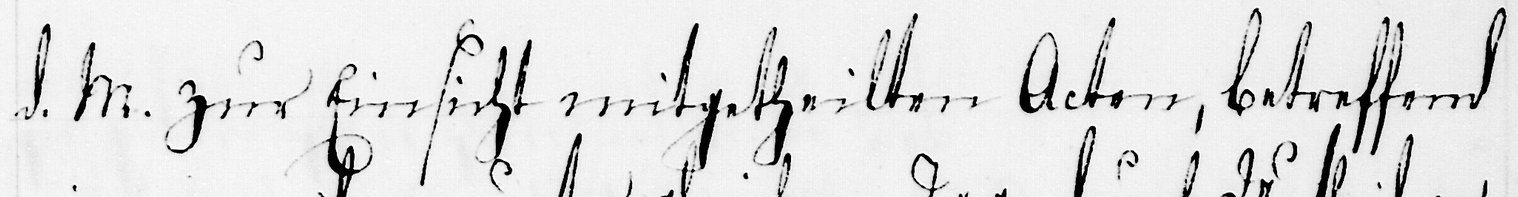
d. M. zur Einsicht mitgetheilten Acten, betreffend
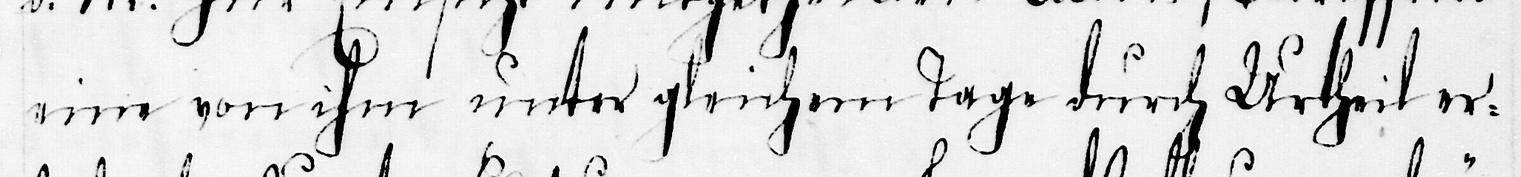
eine von ihm unter gleichem Tage durch Urtheil er¬
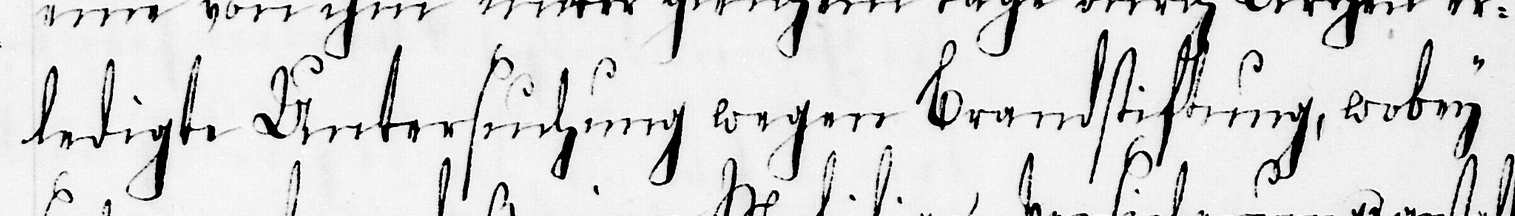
ledigte Untersuchung wegen Brandstiftung, wobey
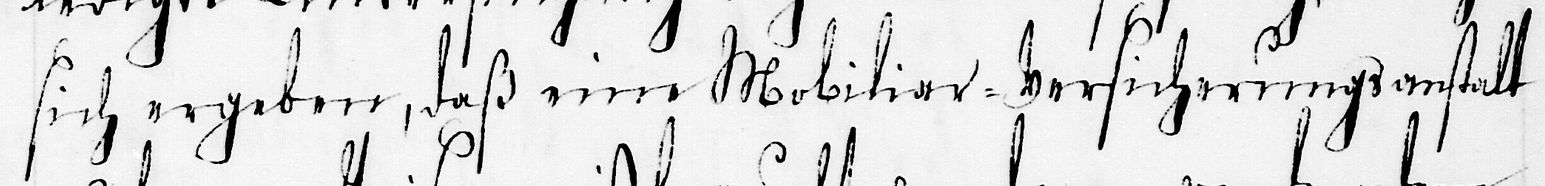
sich ergeben, daß eine Mobiliar-Versicherungsanstalt
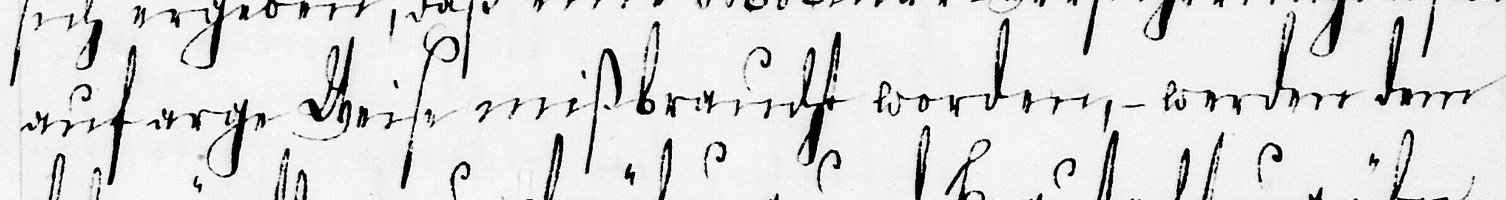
auf arge Weise mißbraucht worden, – werden dem
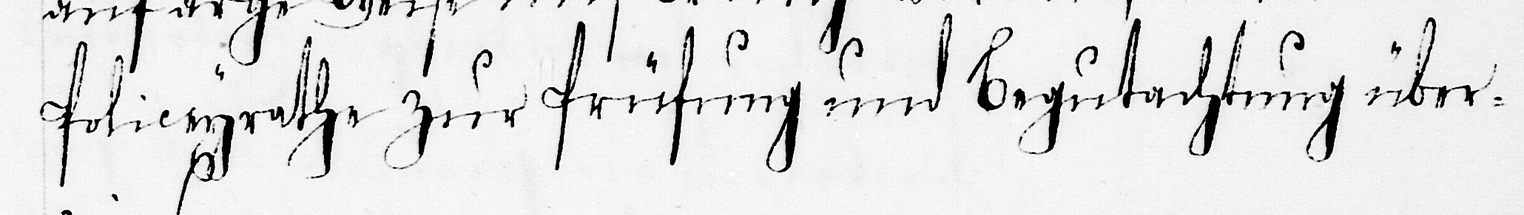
Policeyrathe zur Prüfung und Begutachtung über¬
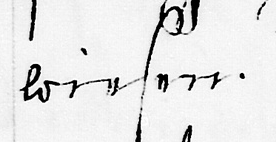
wiesen.
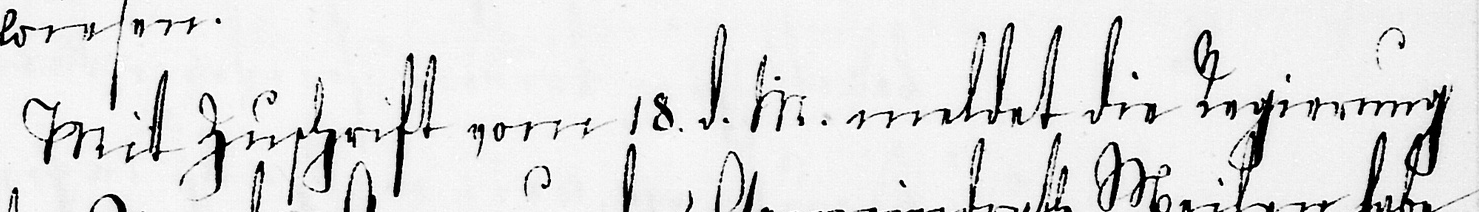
Mit Zuschrift vom 18. d. M. meldet die Regierung
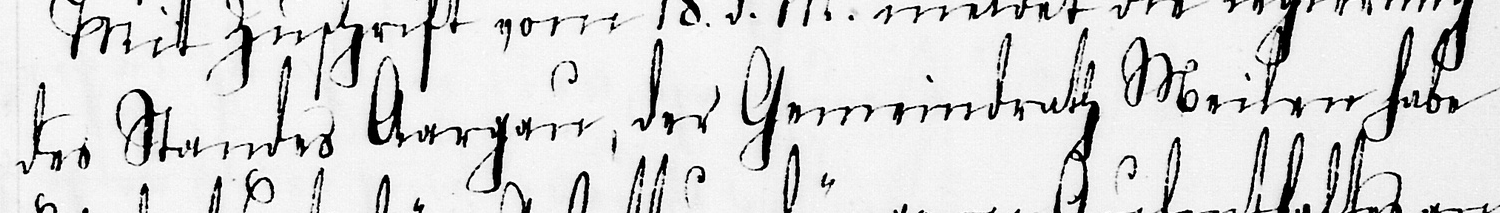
des Standes Aargau, der Gemeindrath Meilen habe
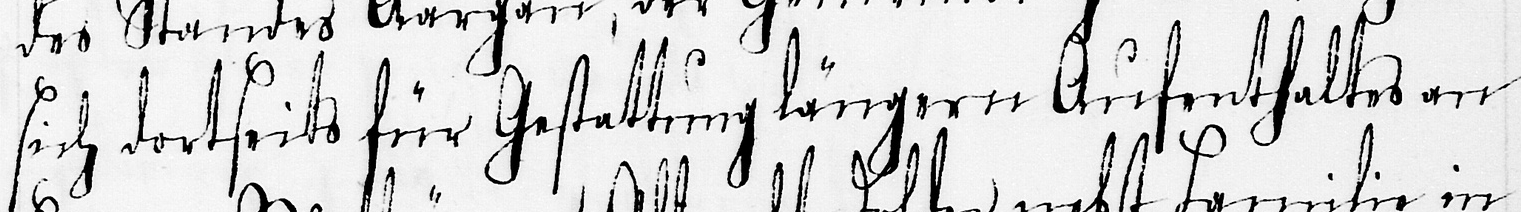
ich dortseits für Gestattung längern Aufenthaltes an
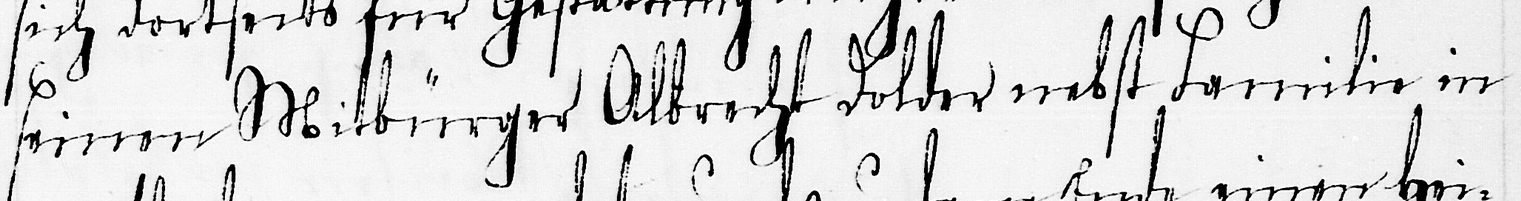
seinen Mitbürger Albrecht Dolder nebst Familie in
